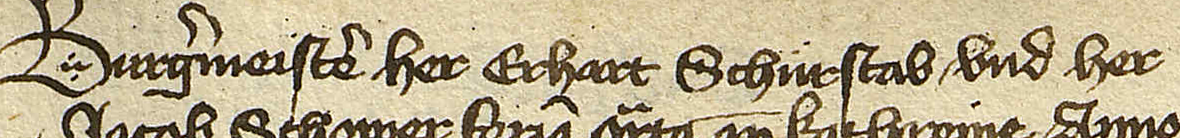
Burg*meiſte* her Erhart Schürſtab / vnd her
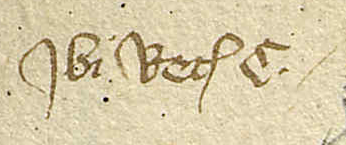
Ibi Rec* C . /
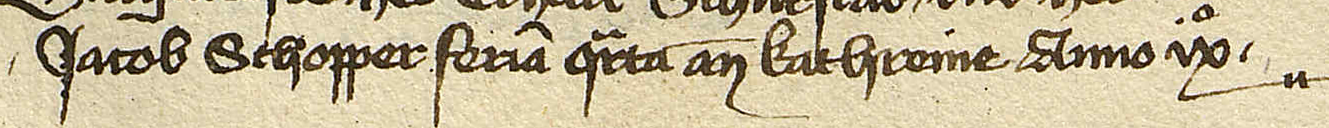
/ Iacob Schopper feria* qrta* an* kathreine Anno ix* /
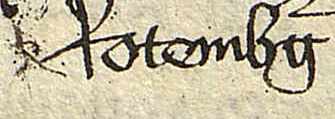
Rotemb*g
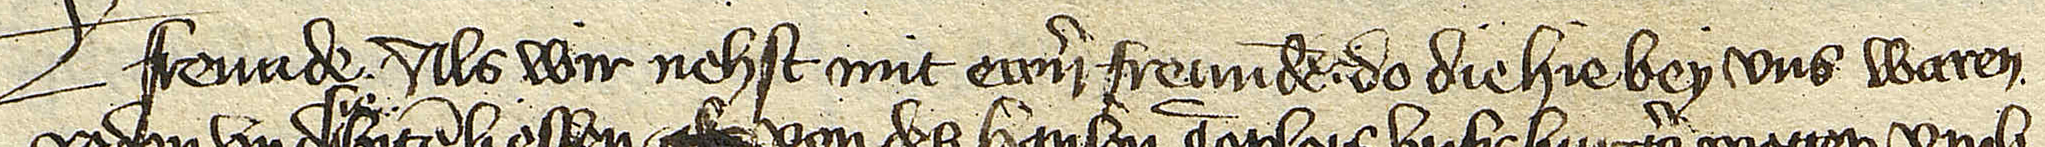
L* freunde / Als wir nehſt mit ewn* freunde* . do die hie bey vns waren
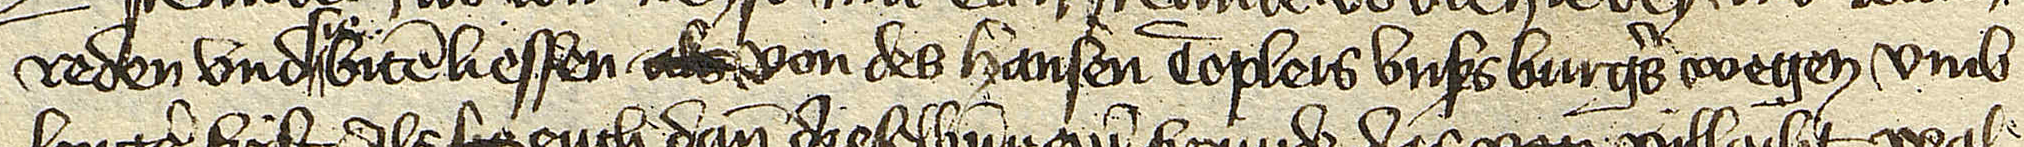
reden vnd bite* lieſſen / als von des hanſen Toplers vnſ*s burg*s wegen vmb
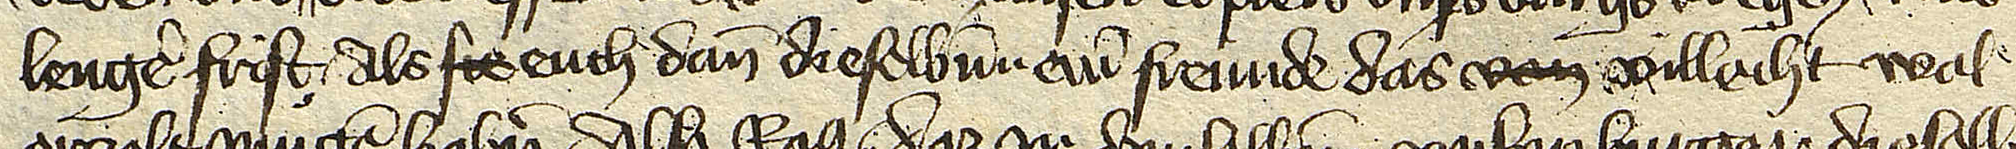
lenge* friſt / Als ſie euch dan* dieſelbn* ~ ew* freunde das von villeicht wol
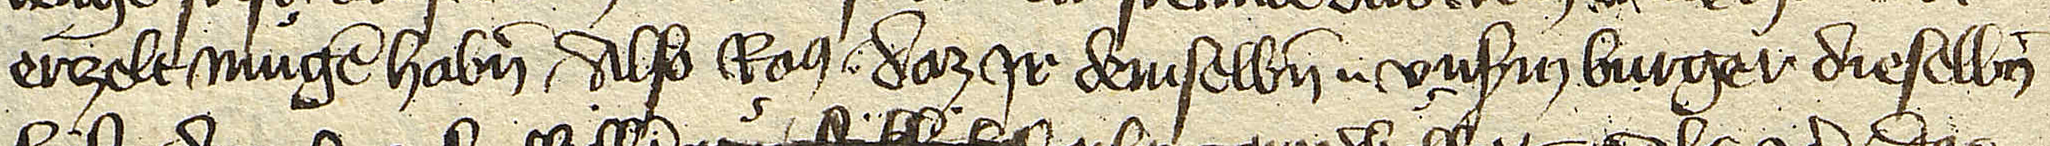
ercʒelt müge* habn* / Also Ro* / daʒ Ir demſelbn* ~ vnſ*m burger dieſelbn*
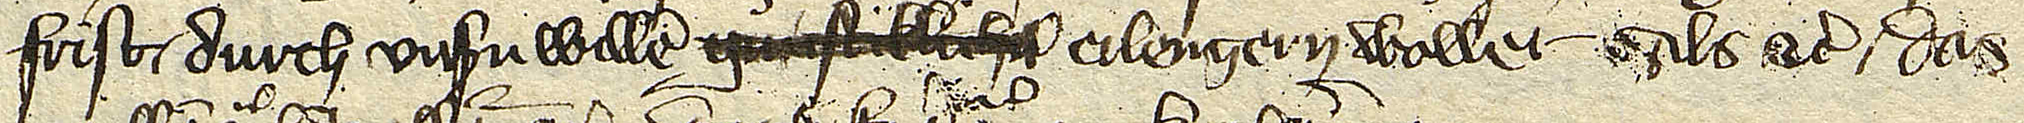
friſt / durch vnſ*n wille günſtiklichn* erlengern wöllet Als ec* / das
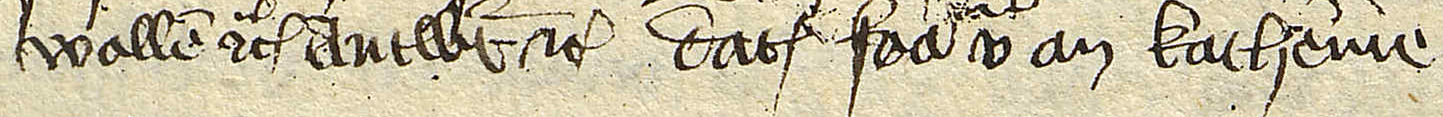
wolle* ec* Antw*t ec* dat* fea* v* an katherie*
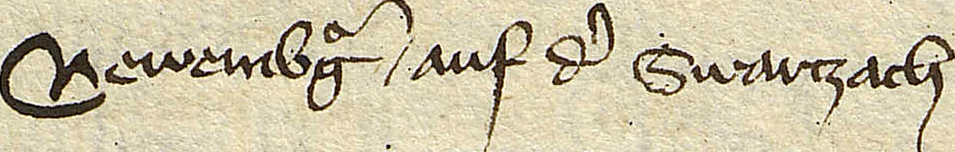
Newemb*g / auf d* Swarcʒach
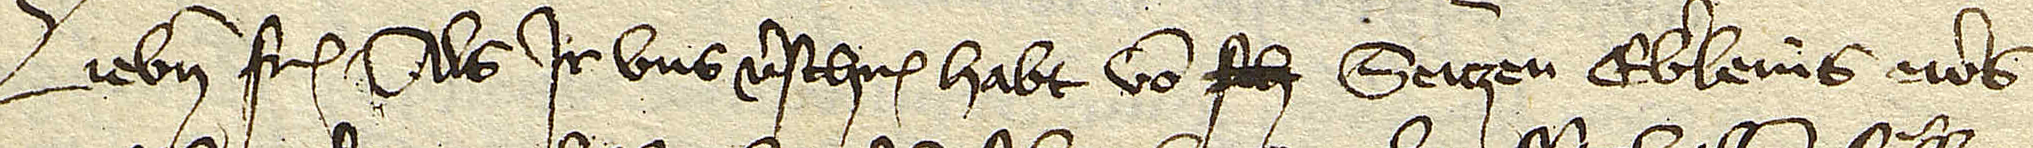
Liebn* fr* / Als Ir vns v*ſchr* habt vo* ſch Seicʒen Eb*leins ew*s
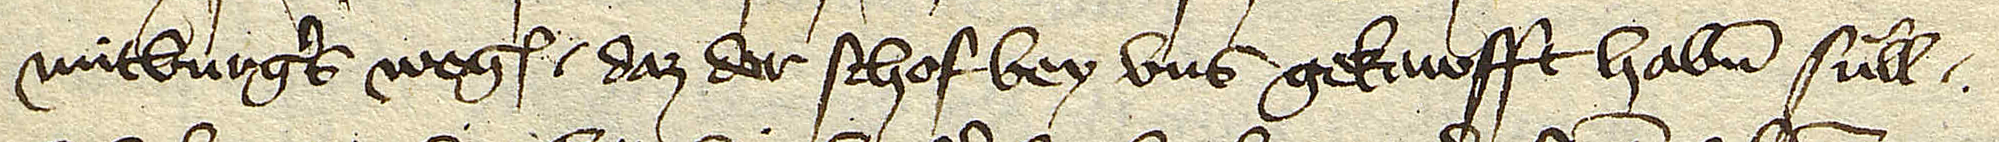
mitburg*s weg* / daʒ der ſchof bey vns gekawfft habn* ſüll /
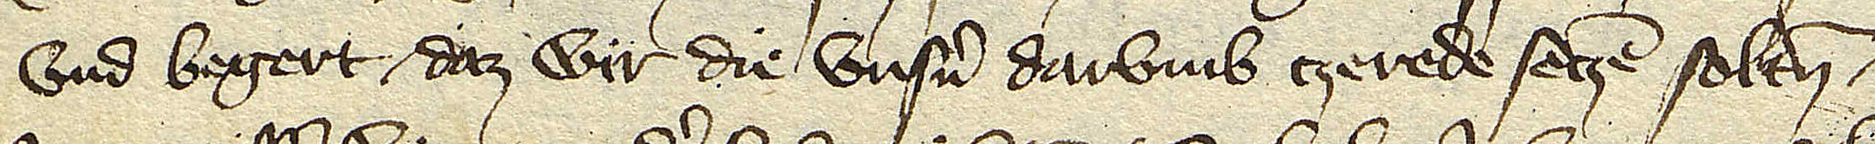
vnd begert / daʒ wie die vnſ*n darvmb cʒerede ſecʒe* ſolt*n /
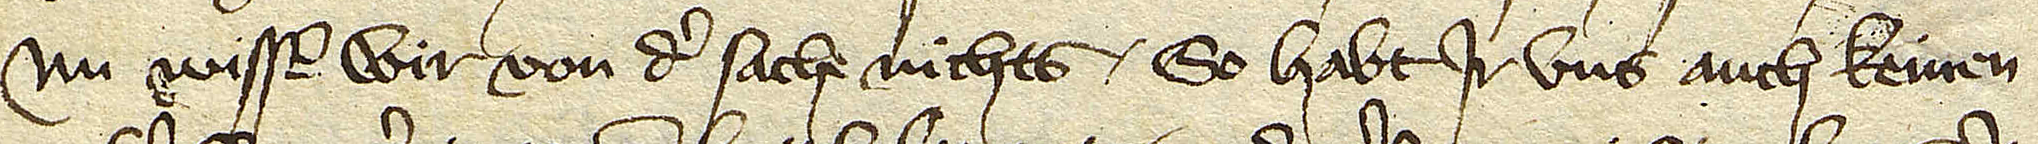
Nu wiſſe* wir von d* ſache nichts / So habt Ir vns auch keinen
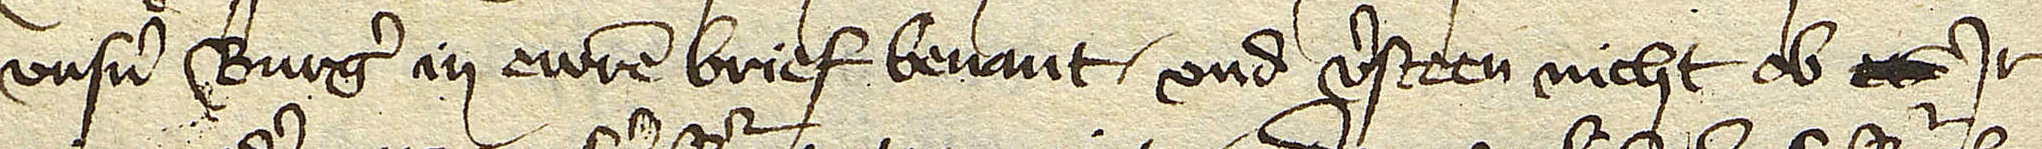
vnſn* Burg* in ewre* brief benant / vnd v*ſteen nicht ob es Ir
